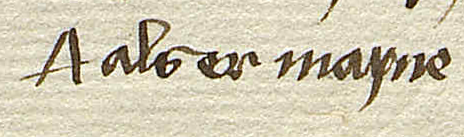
als er mayne
